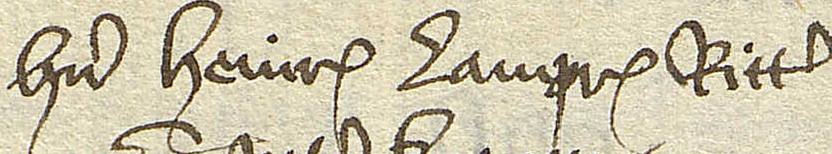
hn* heinr* Lampr* Ritt*
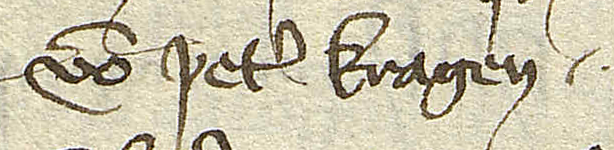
vo* pet* kragen / .
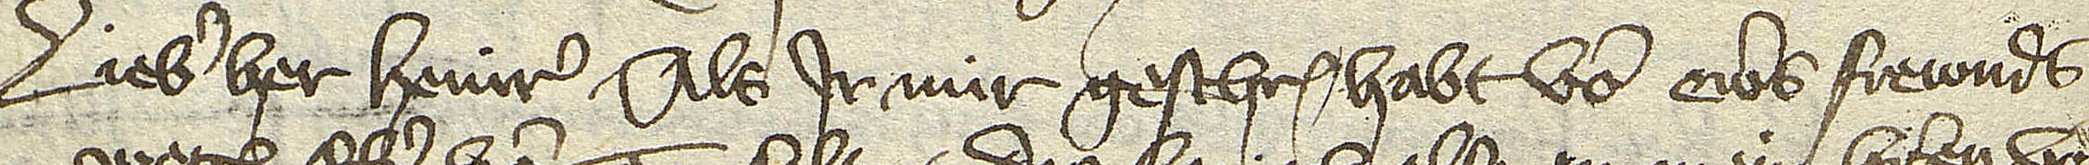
Lieb* her heinr* / Als Ir mir geſchr* habt vo* ew*s frewnds
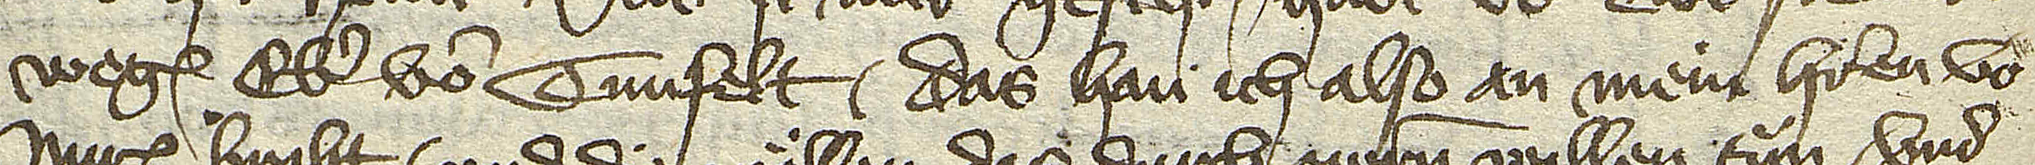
weg* Eb* vo* Tunfelt / Das hab ich alſo an mein hr*en vo*
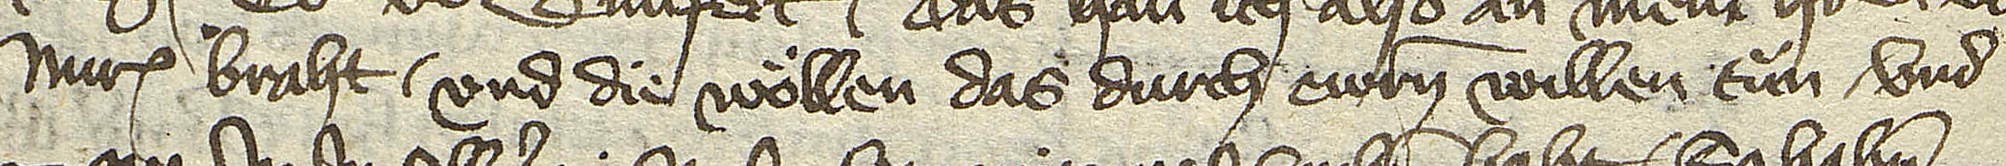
Nur* braht / vnd die wöllen das durch ewrn* willen tün / vnd
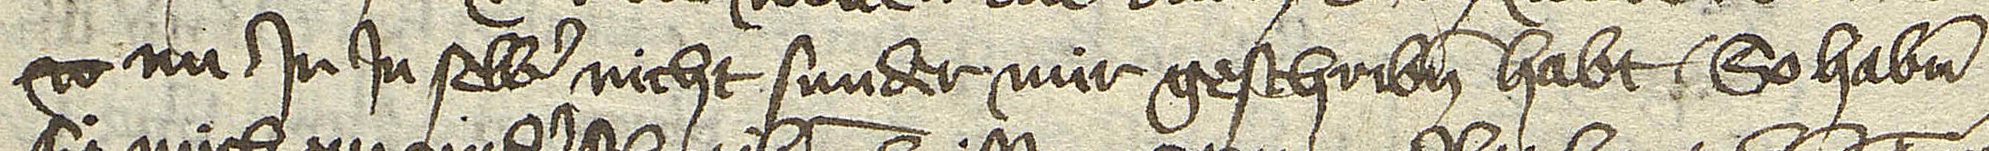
w nu Ir In ſelb* nicht ſunder mir geſchribn* habt / So habn*
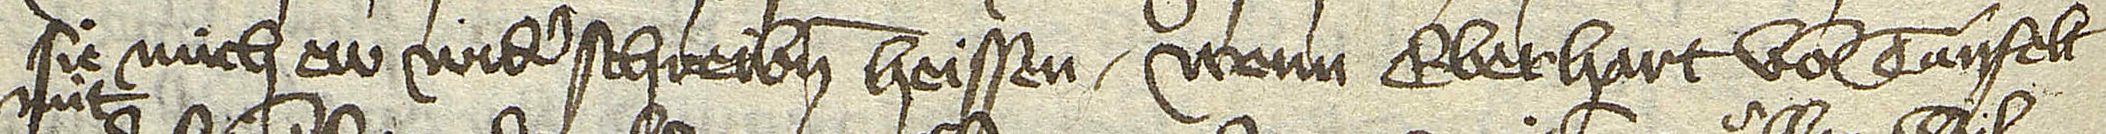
ſie mich ew wid* ſchreibn* heiſſen / wenn Eberhart vo* Tünfelt
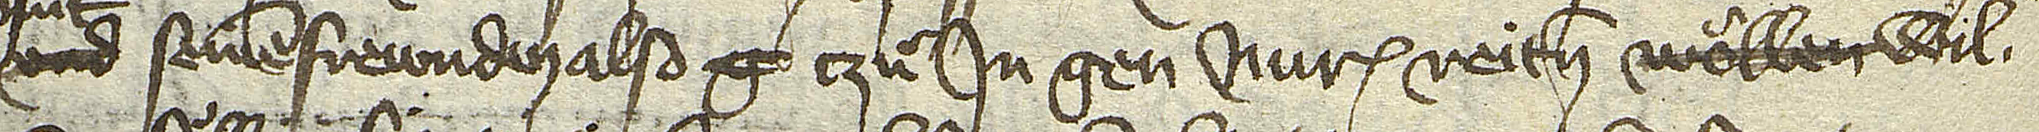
vnd ſeine* frewnde alſo g cʒü In gen Nur* reitn* wöllen wil .
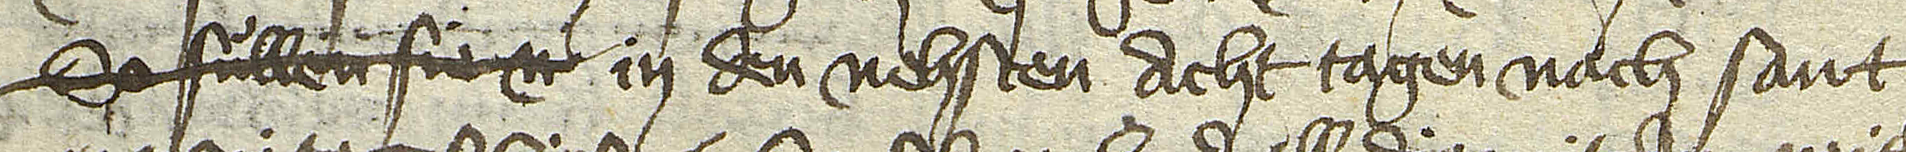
So ſüllen ſie i in den nehſten Acht tagen nach ſant
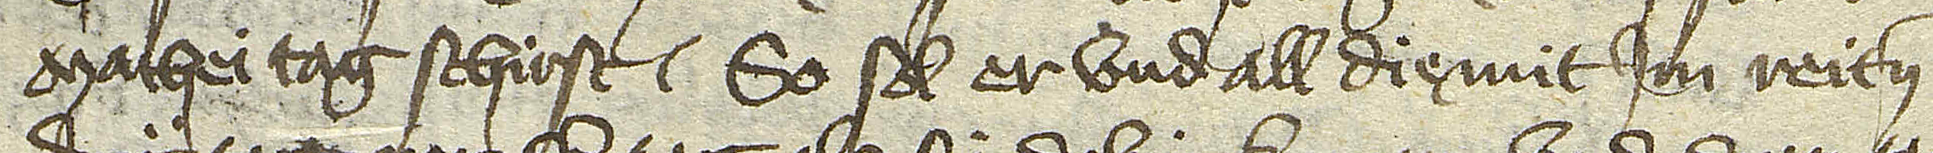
Mathei tag ſchirſt / So ſol er vnd all die mit Im reitn*
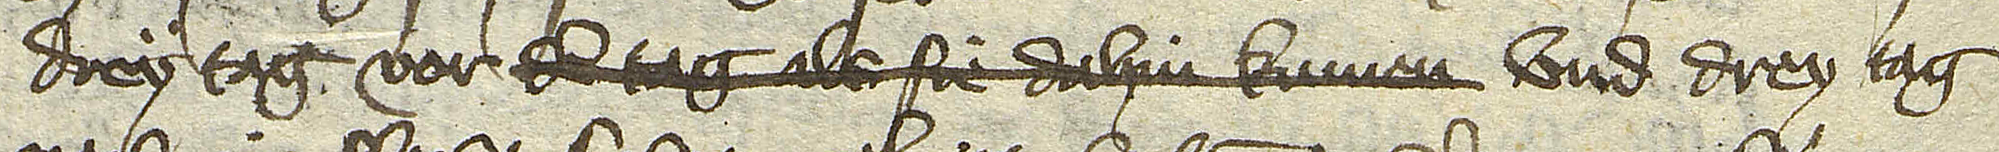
drey tag vor d* tag als ſie dahin kumen vnd drey tag
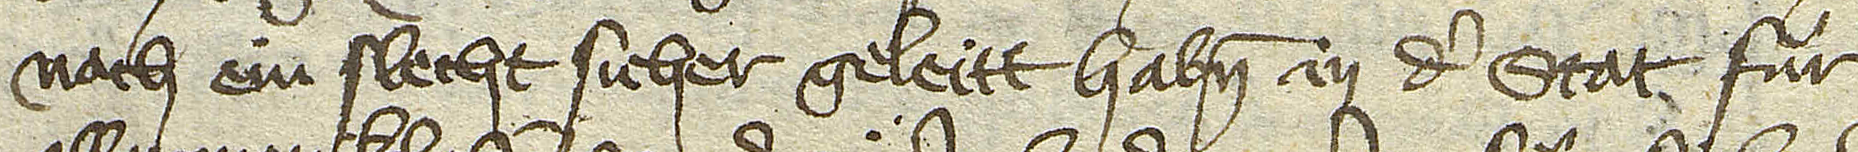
nach ein ſlecht ſicher geleitt habn* in d* Stat für
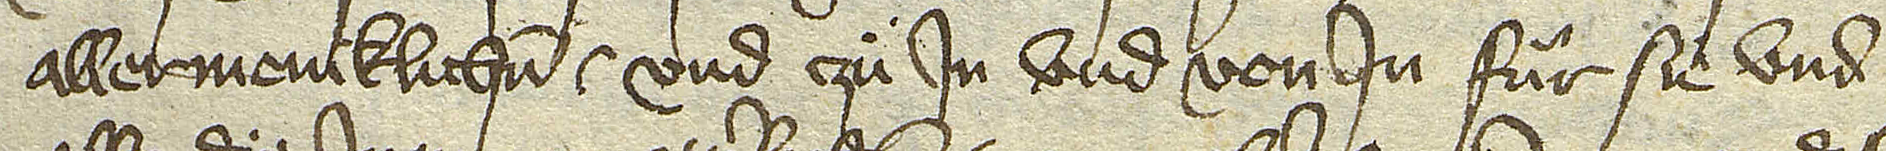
allermeniklichn* / vnd cʒü In vnd von In für ſie vnd
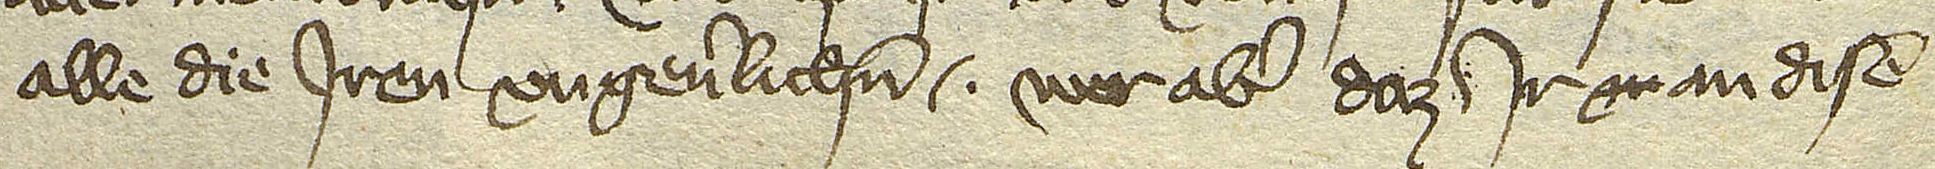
alle die Iren vngeu*lichn* / . wer ab* daʒ Ir in an diſe*
